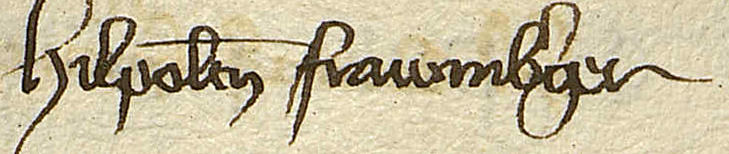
Hilpoltn* frawmb*ger
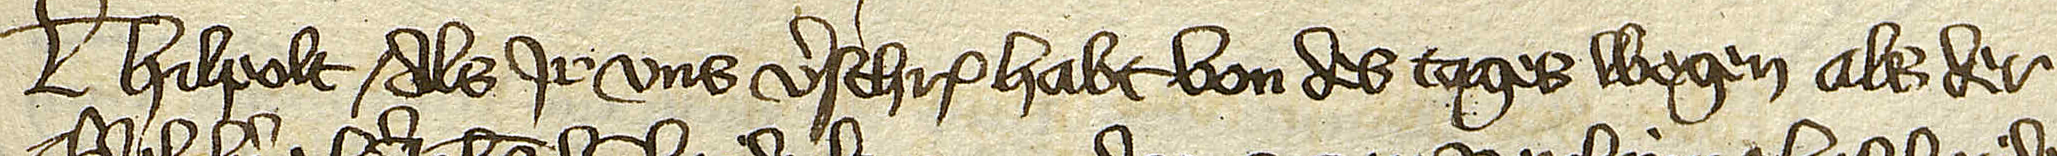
L* hilpolt / Als Ir vns v*ſchr* habt von des tages wegen als der
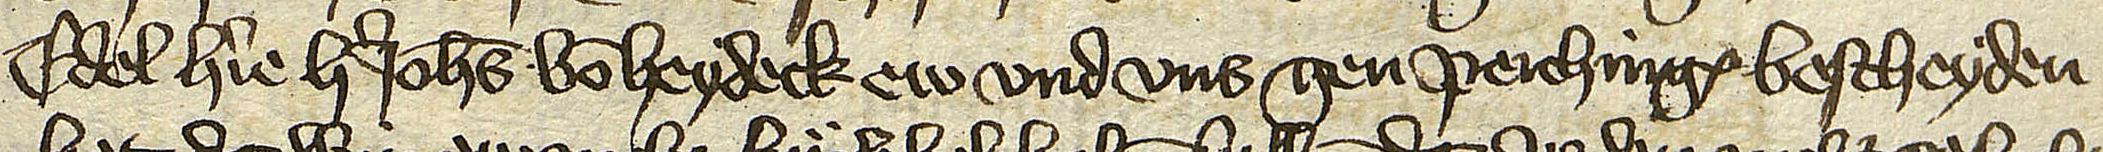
Edel h*re h* Iohs* vo* heydeck ew vnd vns gen Perching* beſcheyden
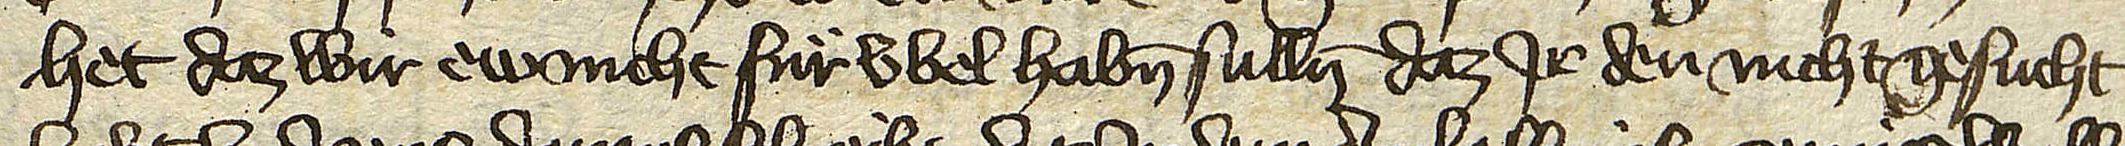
het daʒ wir ew nicht für vbel habn* ſulln* daʒ Ir den nicht geſucht
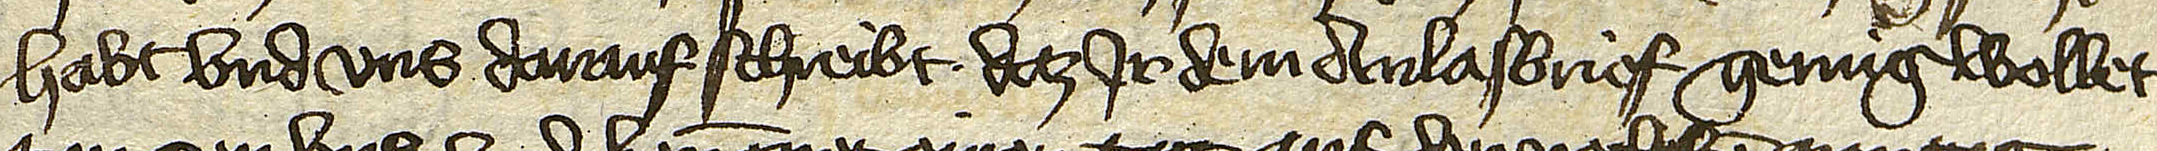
habt vnd vns darauf ſchreibt daʒ Ir dem Anlaſbrief genüg wollet
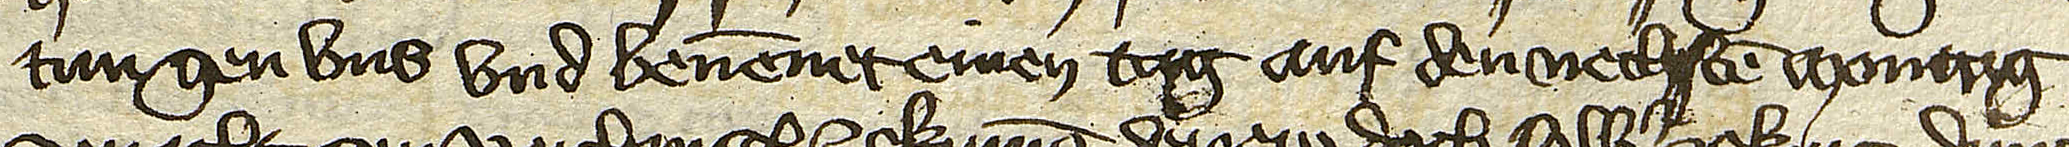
tun gen vns vnd benenet* einen tag auf den nechſte* Montag
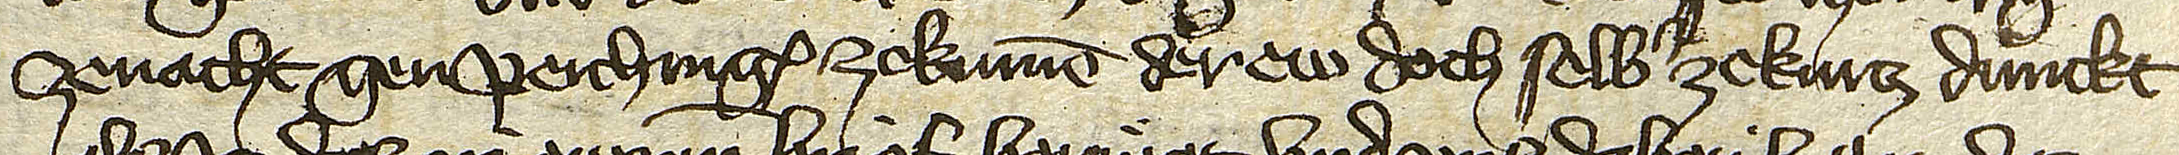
cʒenacht gen Perching* cʒekume* der ew doch ſelb* cʒekurcʒ dünckt
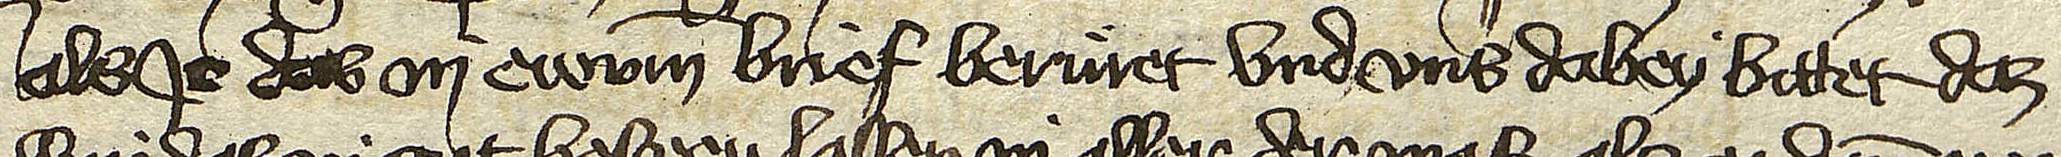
als Ir das in ewrm* brief berüret vnd vns dabey bittet daʒ
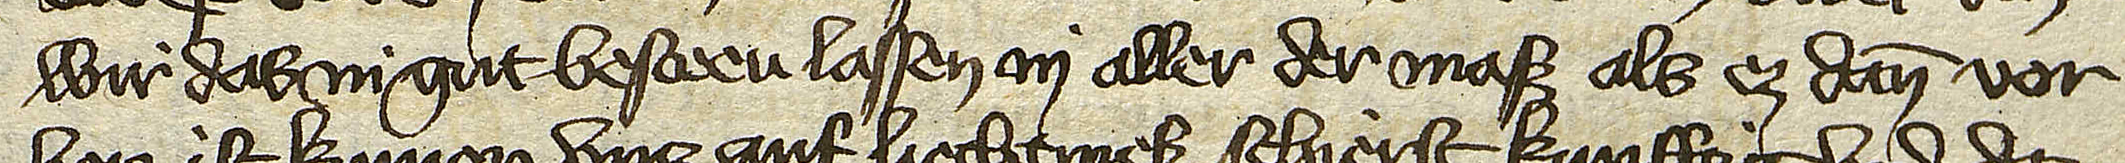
wir das in gut beſteen laſſen in aller der maſʒ als eʒ dan* vor
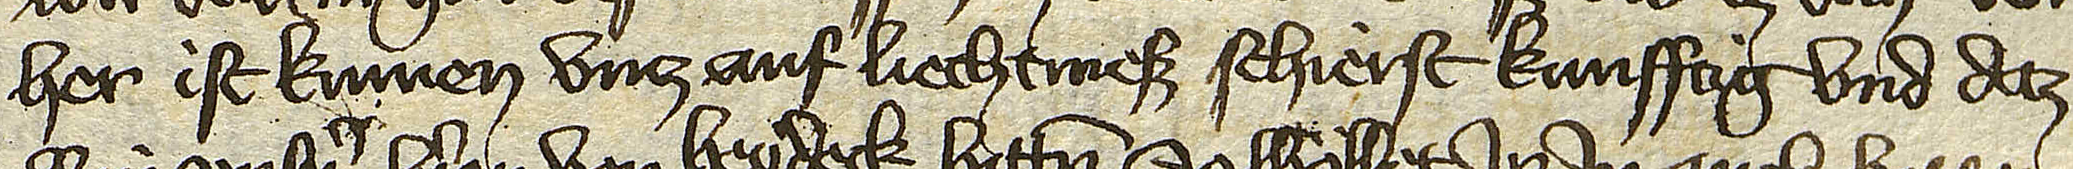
her iſt kume vncʒ auf liechtmeſʒ ſchierſt kunfftig vnd daʒ
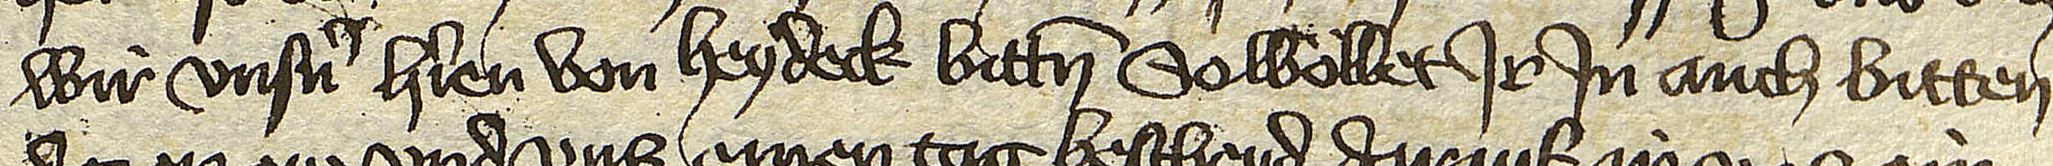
wie vnſn* h*ren von heydeck bittn* So wöllet Ir In auch bitten
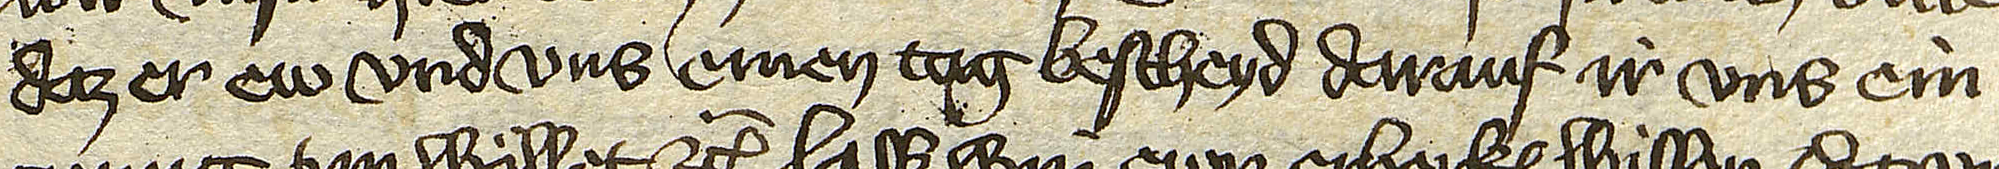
daʒ er ew vnd vns einen tag beſcheyd darauf ir vns ein
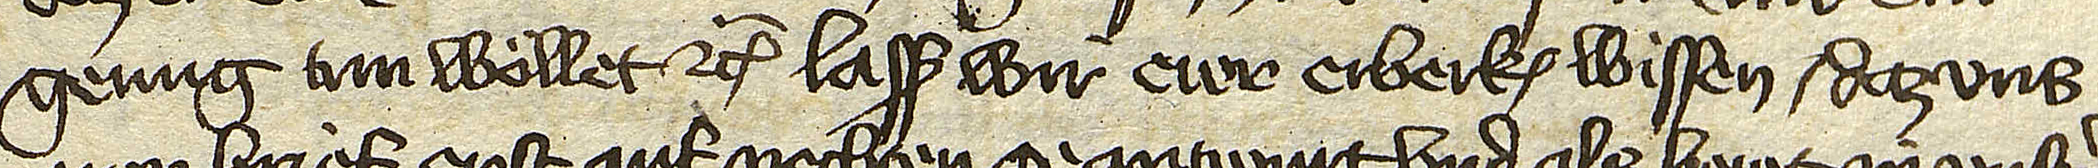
genug tun wöllet ec* laſſ* wir ewr erberk* wiſſen / daʒ vns
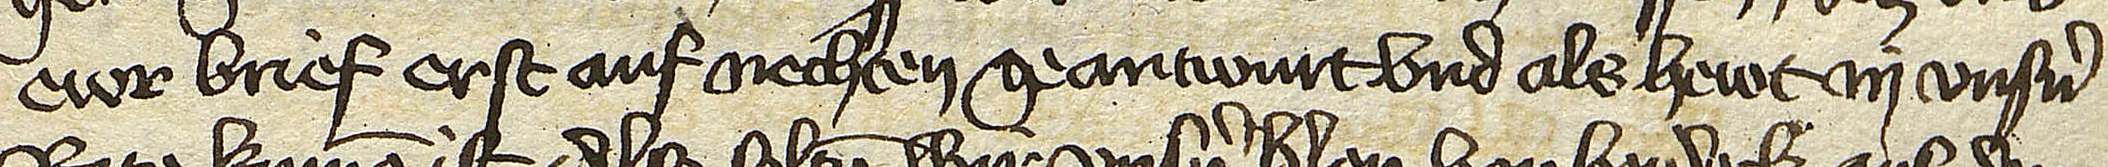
ewr brief erſt auf nechten geantwurt vnd als hewt in vnſn*
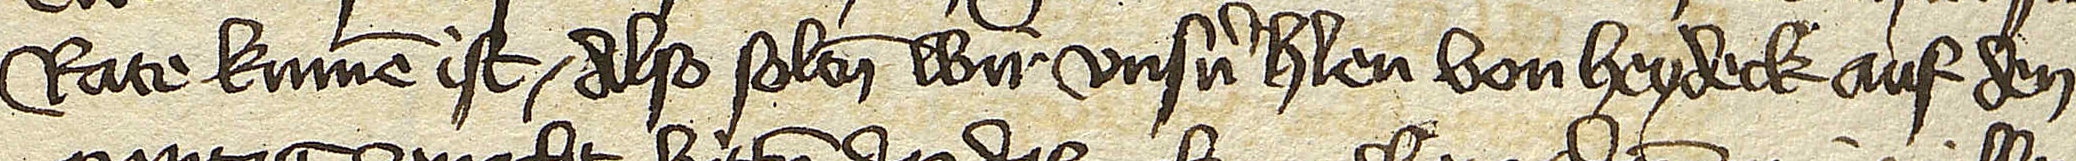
Rate kume* iſt / Alſo ſoltn* wir vnſn* h*ren von heydeck auf den
